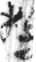檐（擔）
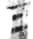三
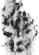檐（擔）
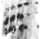三
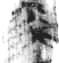赤
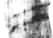二
